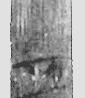五
